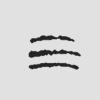三
